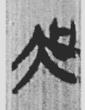吴
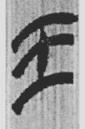王
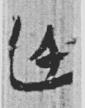身
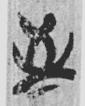至
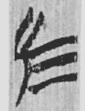於
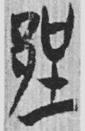郢
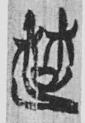楚
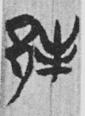邦
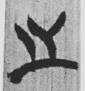之
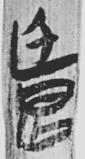良
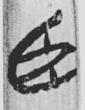臣
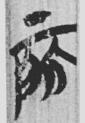所
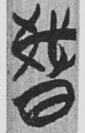○（暴）
